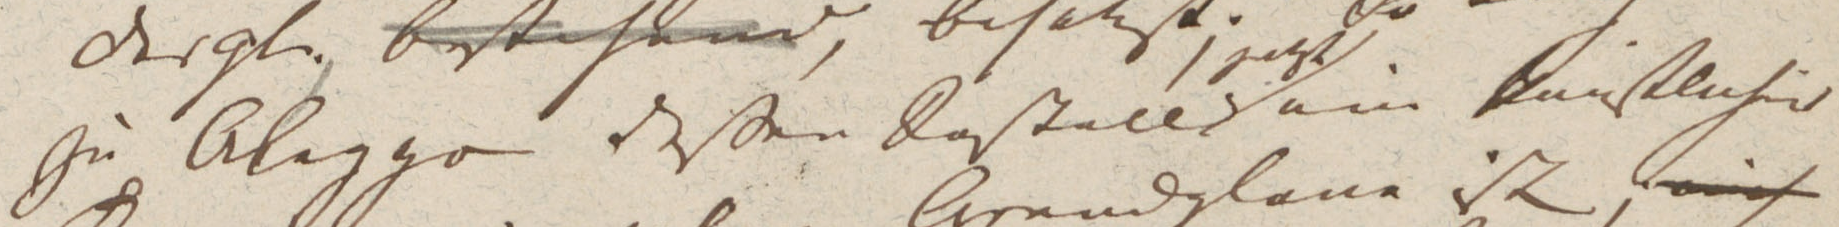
zu Aleppo dessen Kastell jetzt ein künstlicher
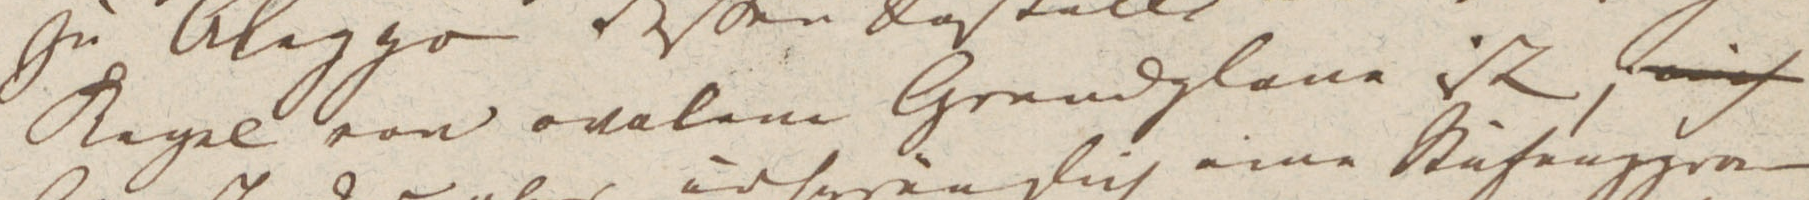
Kegel von ovalem Grundplane ist, auch
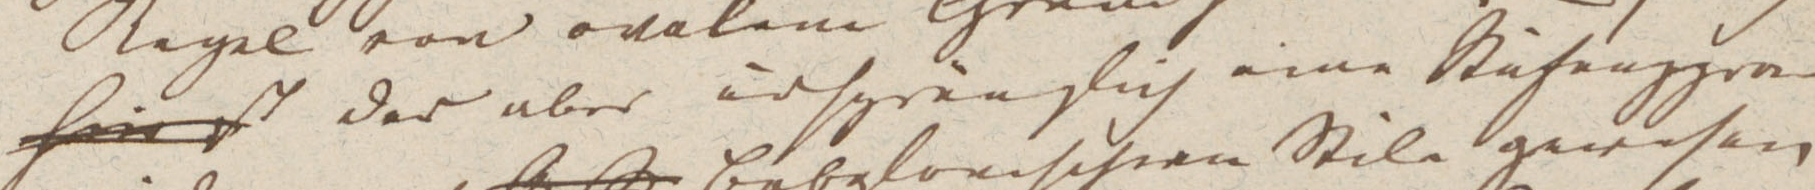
hier is der aber ursprünglich eine Stufenpyra-
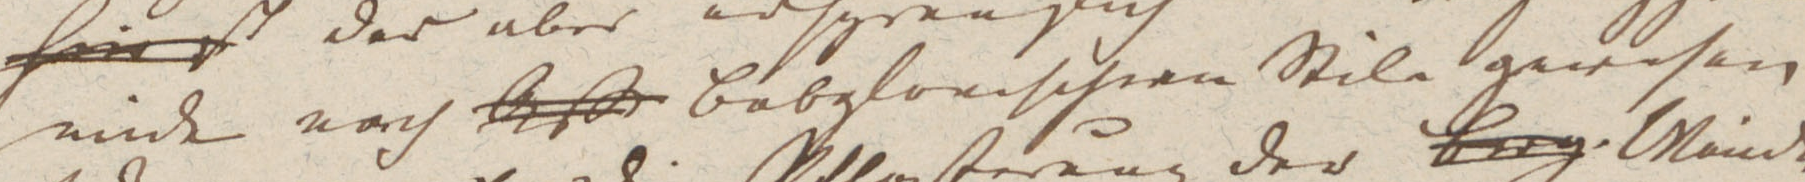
mide nach Ass Babylonischem Stile gewesen
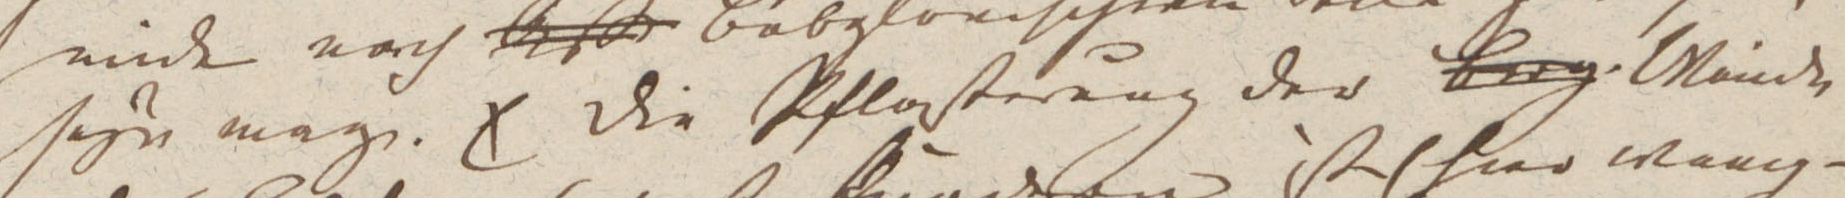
seyn mag. Die Pfasterung der BergWände
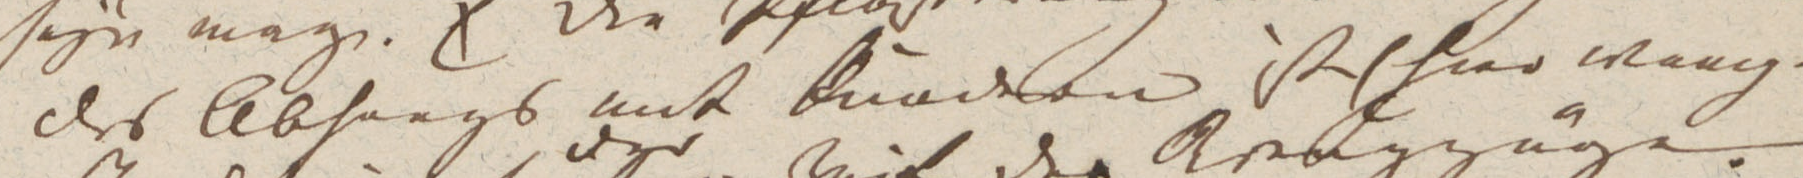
des Abhangs mit Quadern ist (hier wenig-
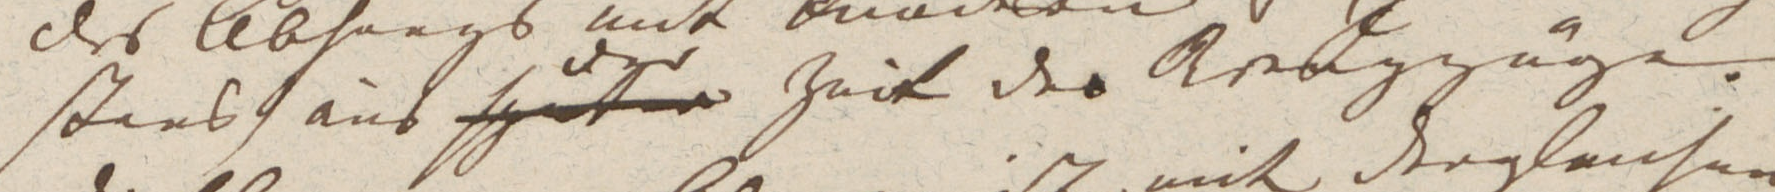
stens) aus später der Zeit de Kreuzzüge.
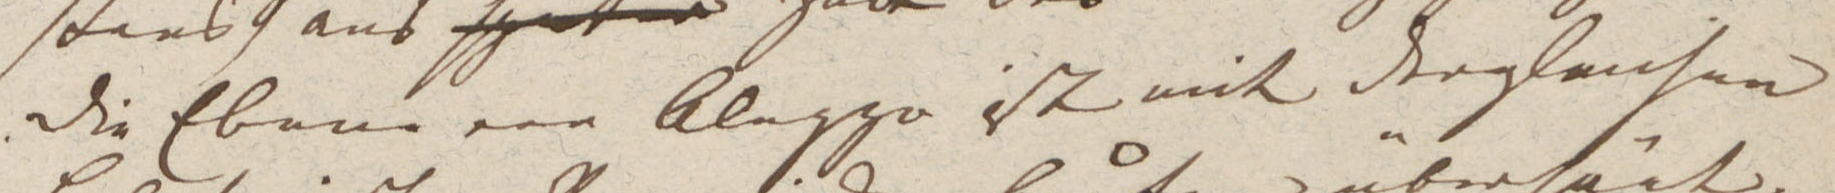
Die Ebene von Aleppo ist mit dergleichen
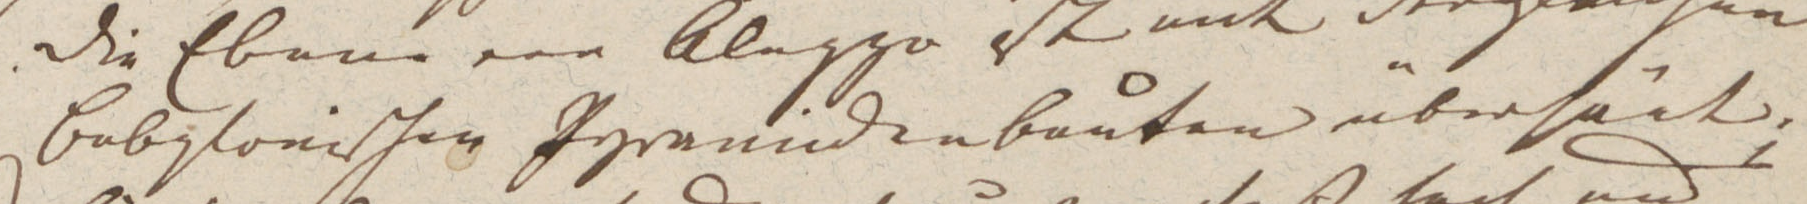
Babylonischen Pyramidenbauten übersäet;
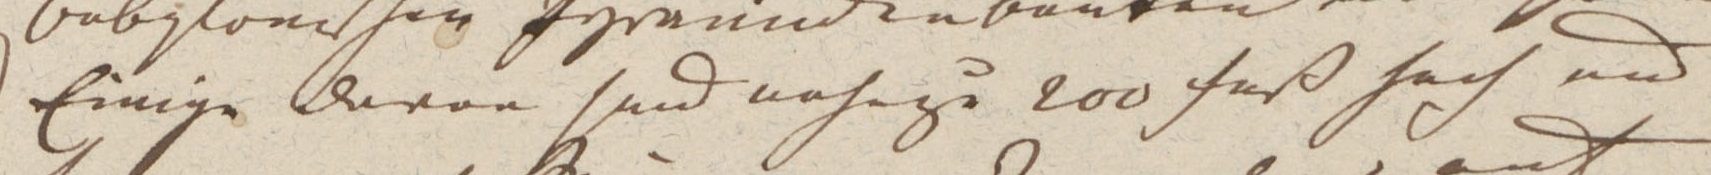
Einige davon sind nahezu 200 Fuss hoch und
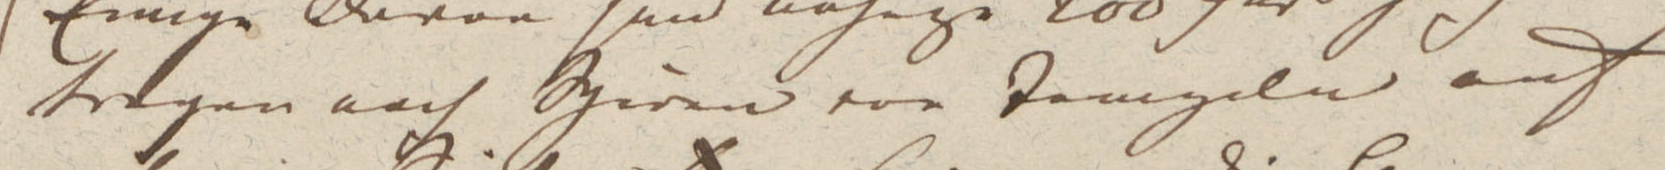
tragen noch Spuren von Tempeln auf
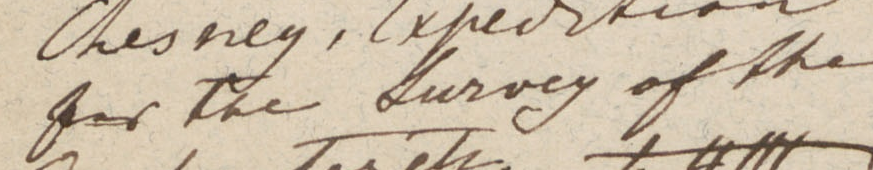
for the Survey of the
